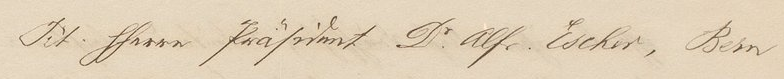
Tit. HHerrn Präsident Dr Alfr. Escher, Bern
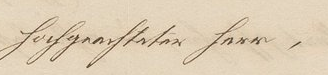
Hochgeachteter Herr,
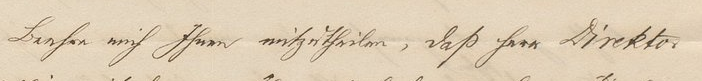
Beehre mich Ihnen mitzutheilen, daß Herr Direktor
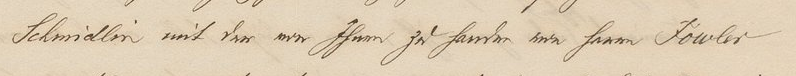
Schmidlin mit der von Ihnen zu Handen von Herrn Fowler
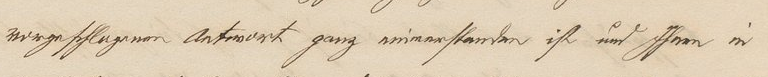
vorgeschlagenen Antwort ganz einverstanden ist und Ihnen in
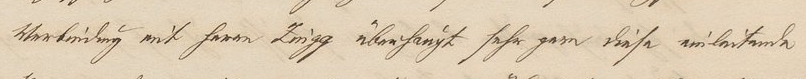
Verbindung mit Herrn Zingg überhaupt sehr gern diese einleitende
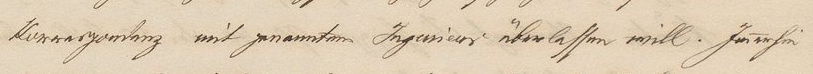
Korrespondenz mit genanntem Ingenieur überlassen will. Immerhin
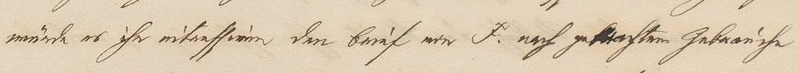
würde es ihn intressiren den Brief von F. nach gemachtem Gebrauche
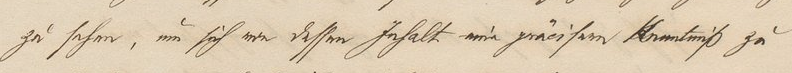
zu sehen, um sich von dessen Inhalt mir präcisere Kenntniß zu
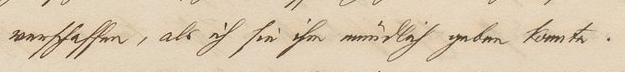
verschaffen, als ich sie ihm mündlich geben konnte.
